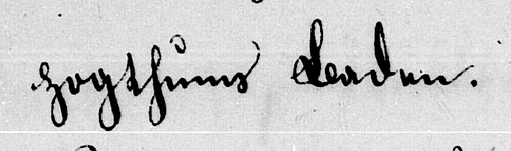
zogthums Baden.
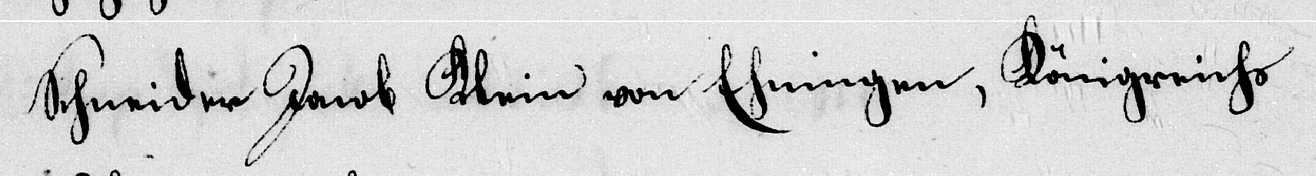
Schneider Jacob Klein von Ehningen, Königreichs
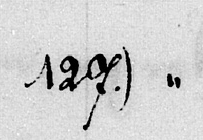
127.) “
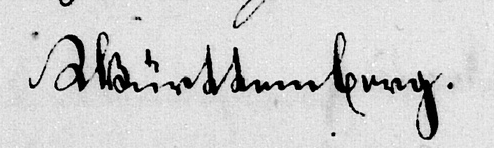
Württemberg.
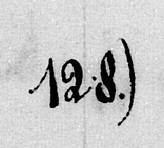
129.)
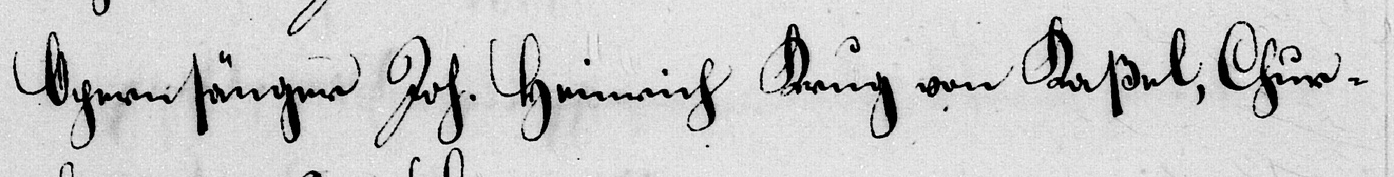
Opernsänger Joh. Heinrich Krug von Kaßel, Chur¬
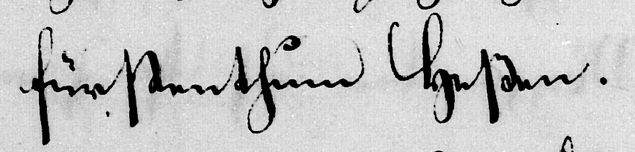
fürstenthum Heßen.
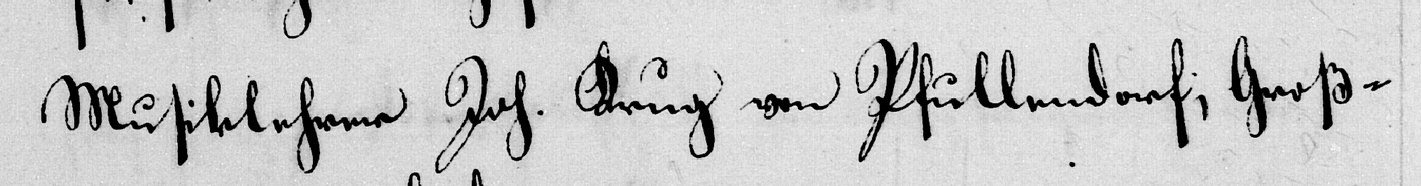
Musiklehrer Joh. Krug von Pfullendorf, Groß¬
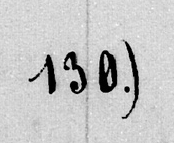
130.)
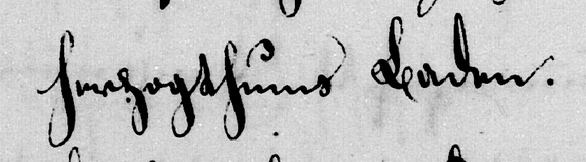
herzogthums Baden.
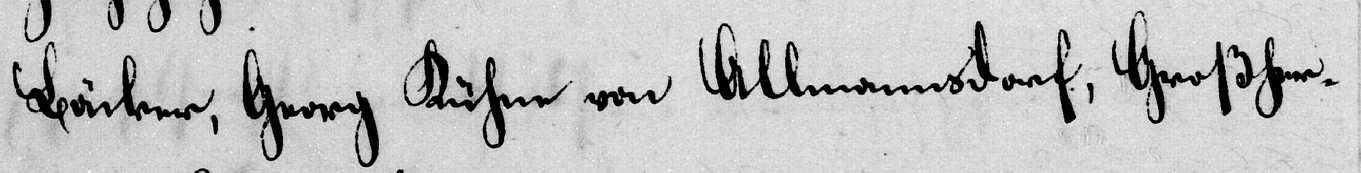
Bäcker, Georg Rüher von Allmannsdorf, Großher¬
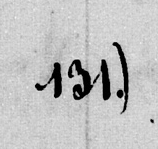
131.)
